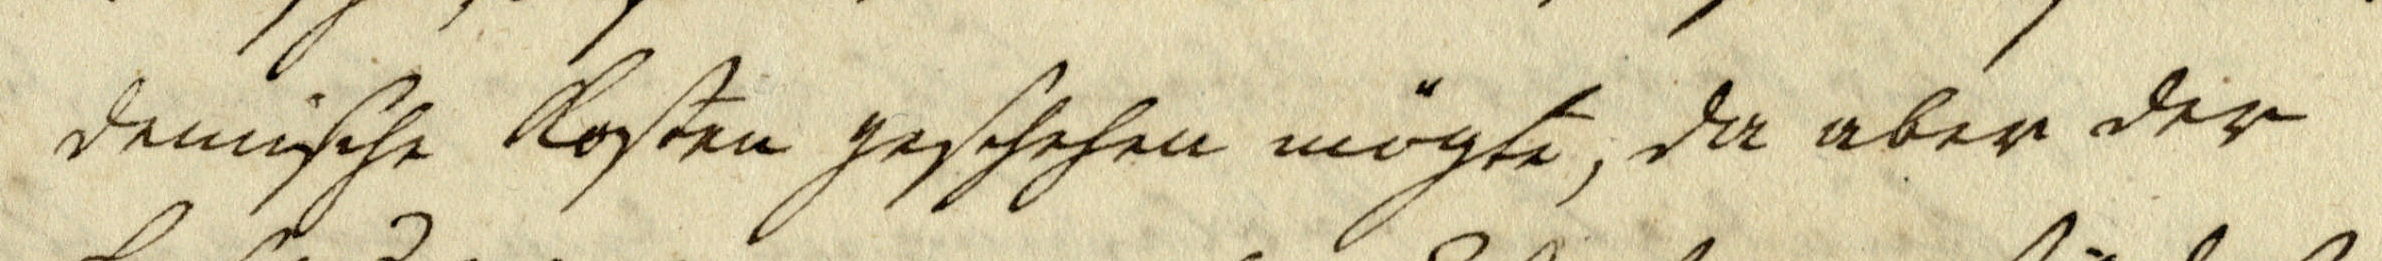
demische Kosten geschehen mögte, da aber der
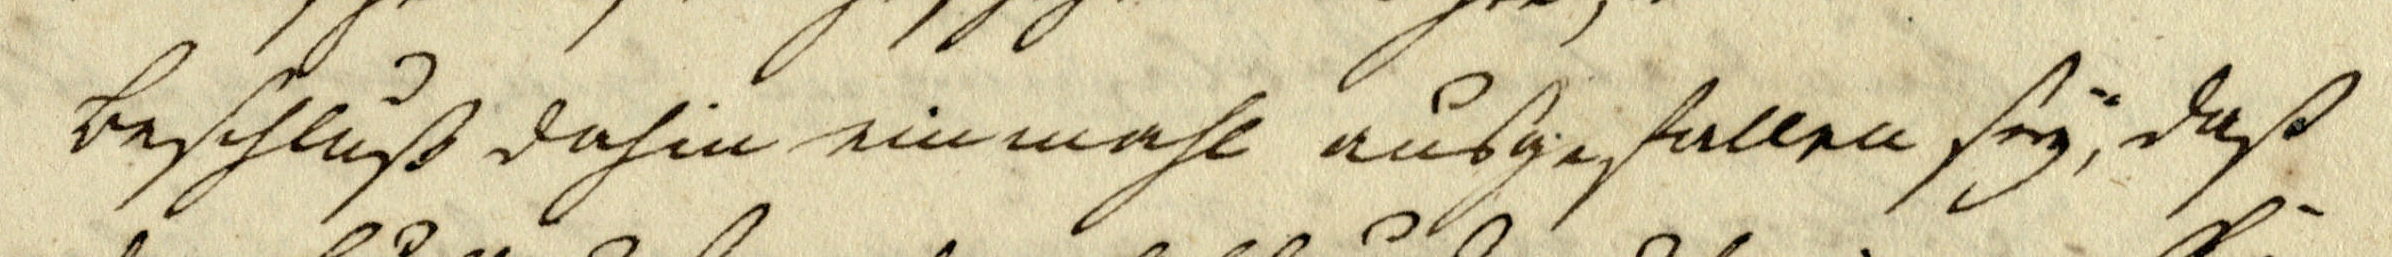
Beschluß dahin einmahl ausgefallen seÿ, daß
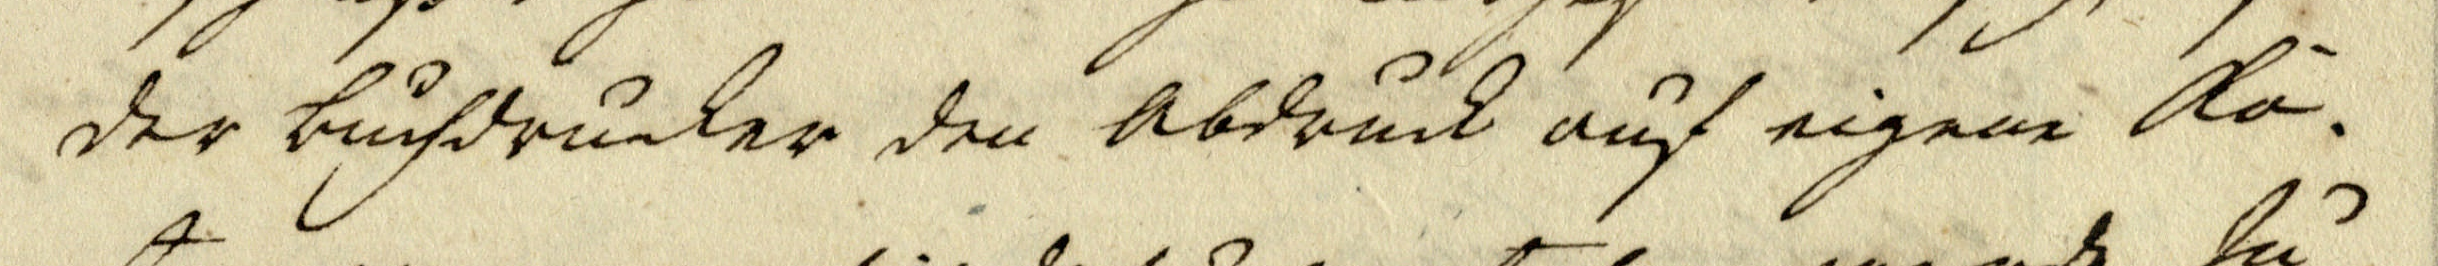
der Buchdrucker den Abdruck auf eigene Ko¬
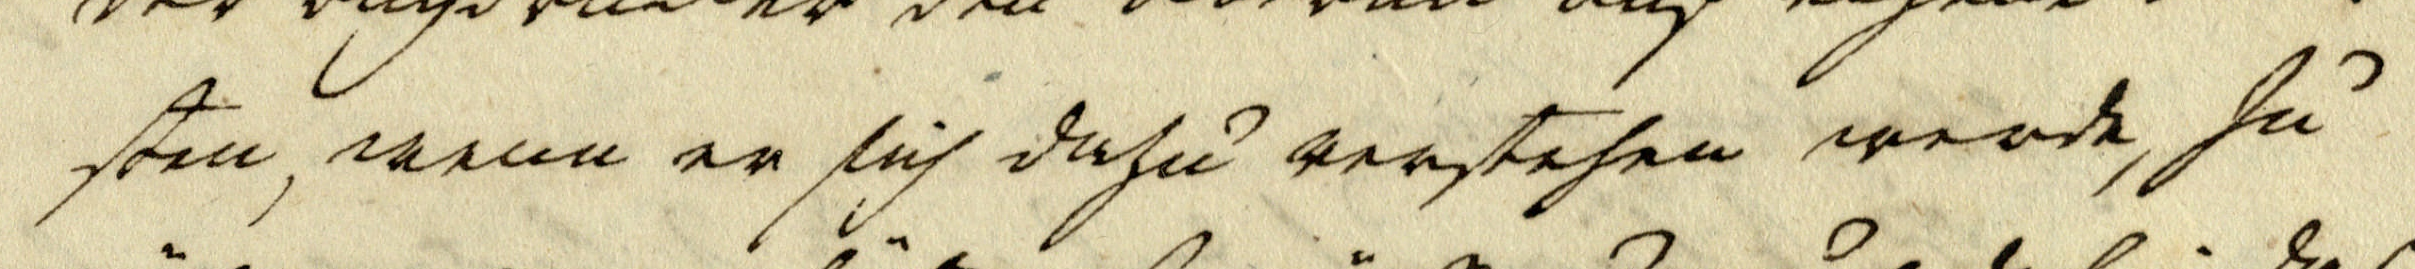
sten, wenn er sich dazu verstehen werde, zu
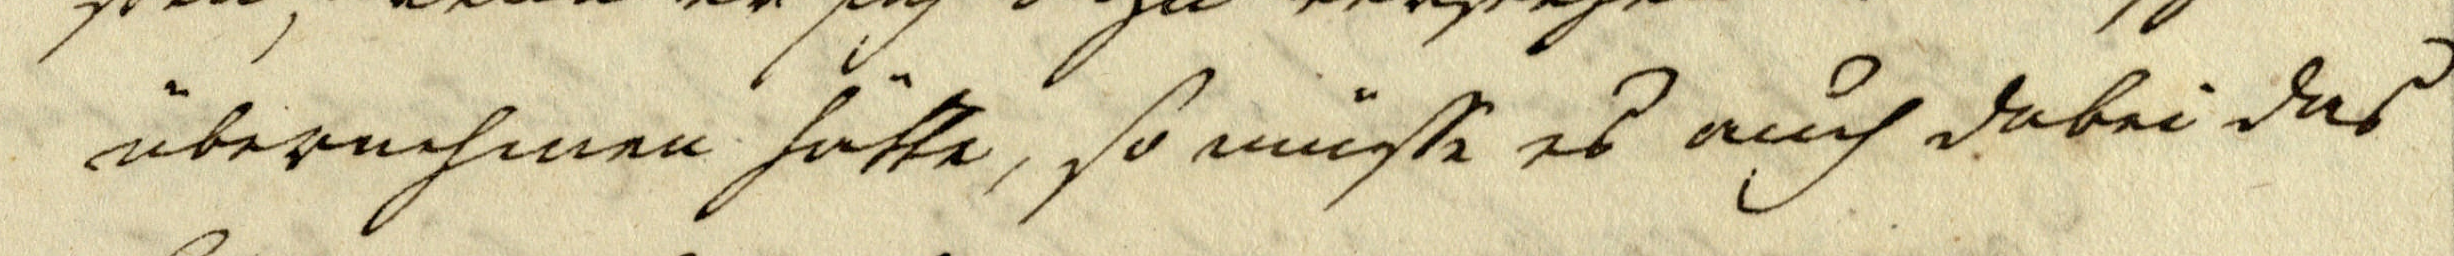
übernehmen hätte, so müsse es auch dabei das
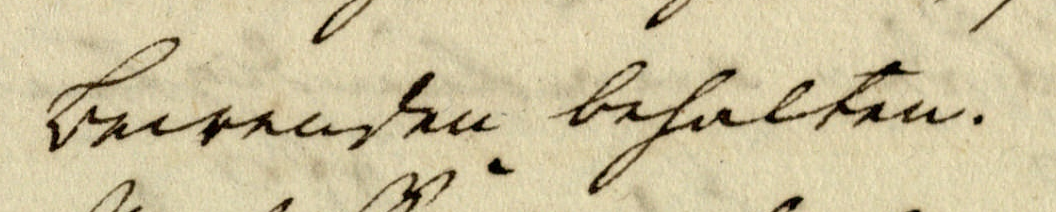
Bewenden behalten.
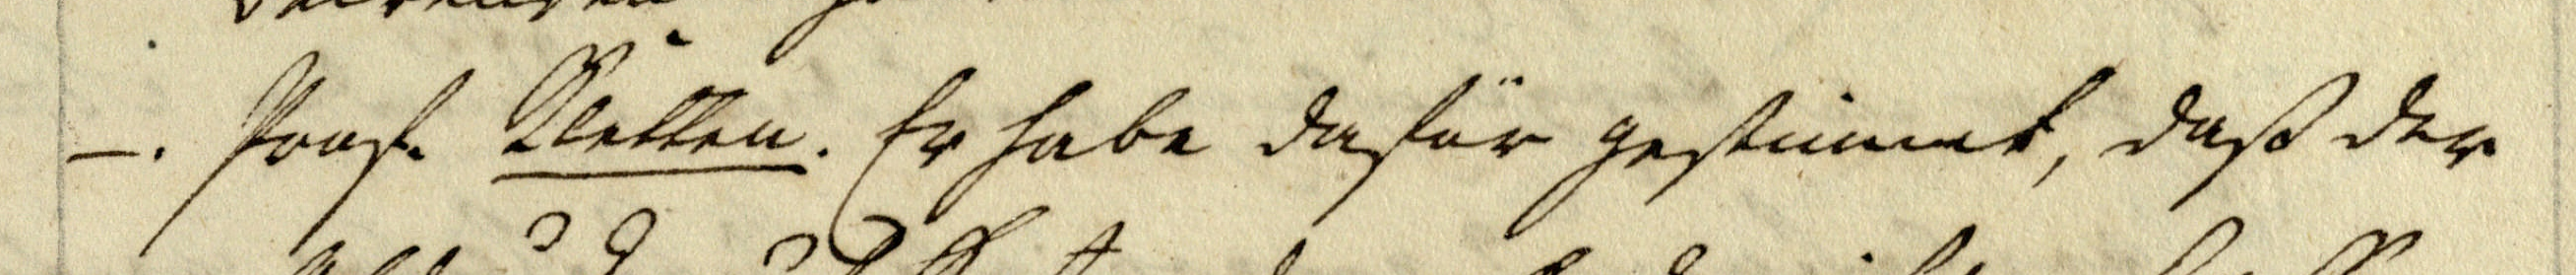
Prof. Kletten. Er habe dafür gestimmt, daß der
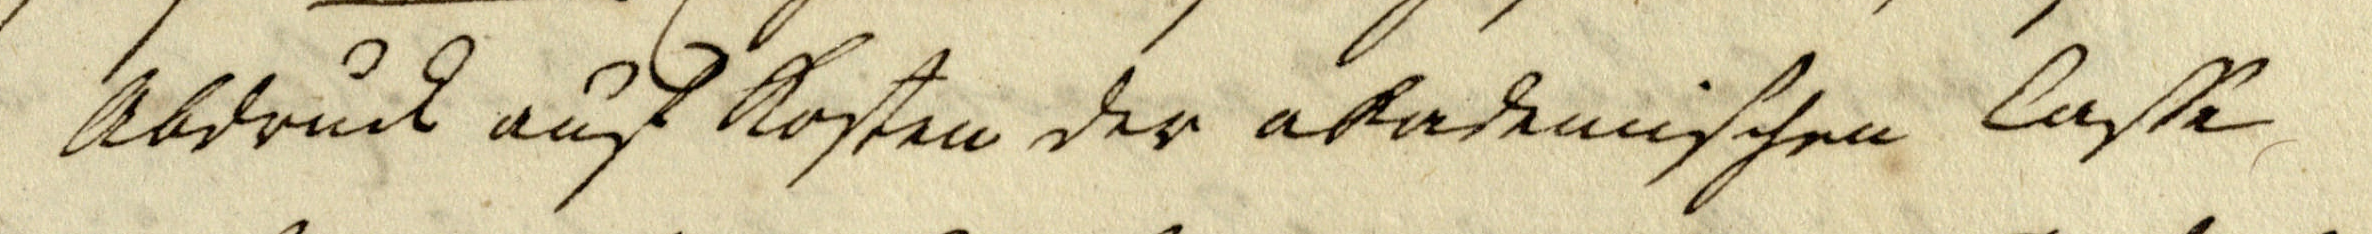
Abdruck auf Kosten der akademischen Casse
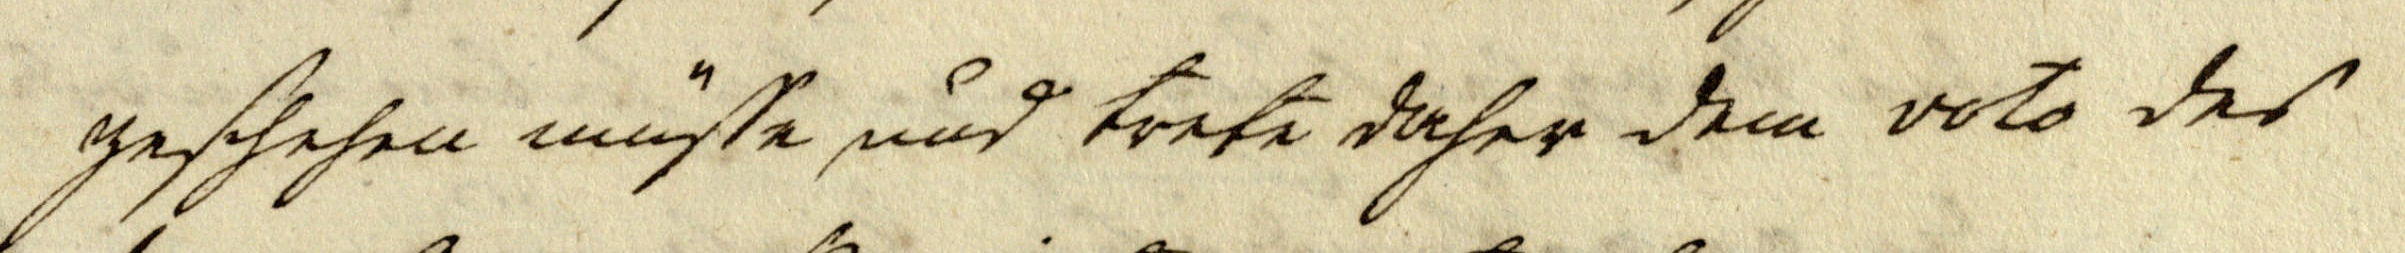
geschehen müsse und trete daher dem voto des
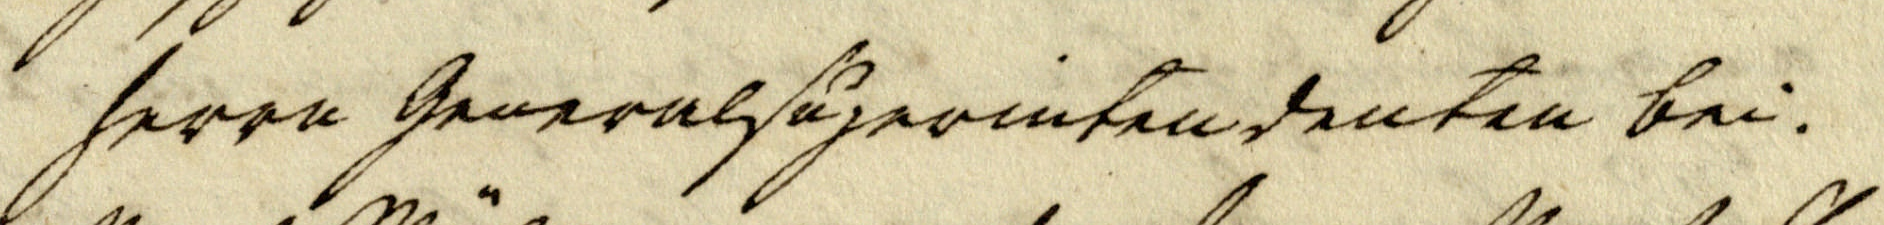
Herrn Generalsuperintendenten bei.
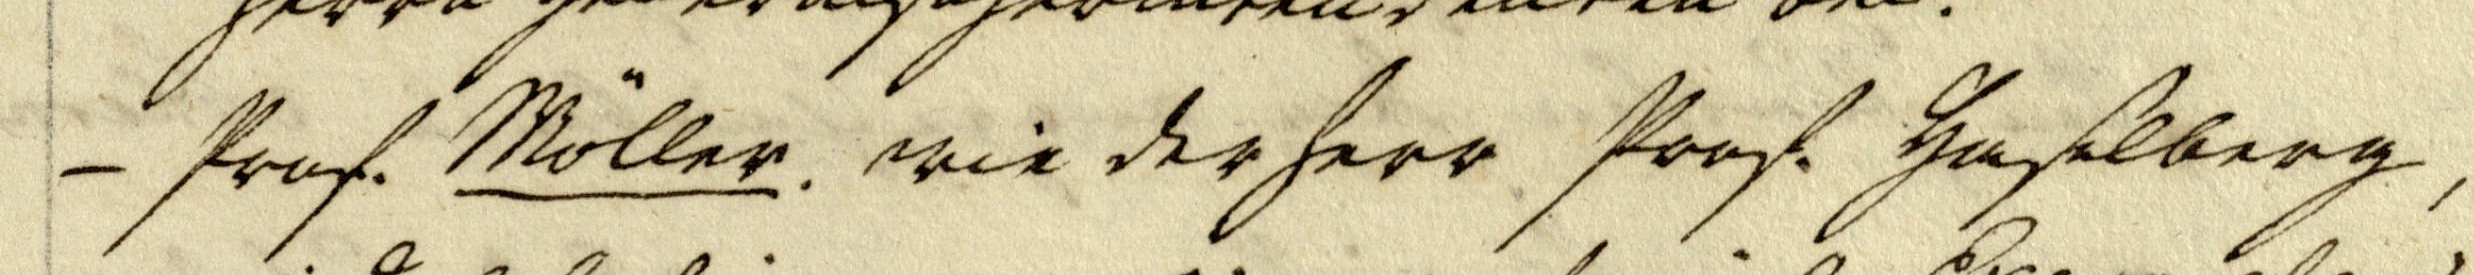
Prof. Möller, wie der Herr Prof. Haselberg,
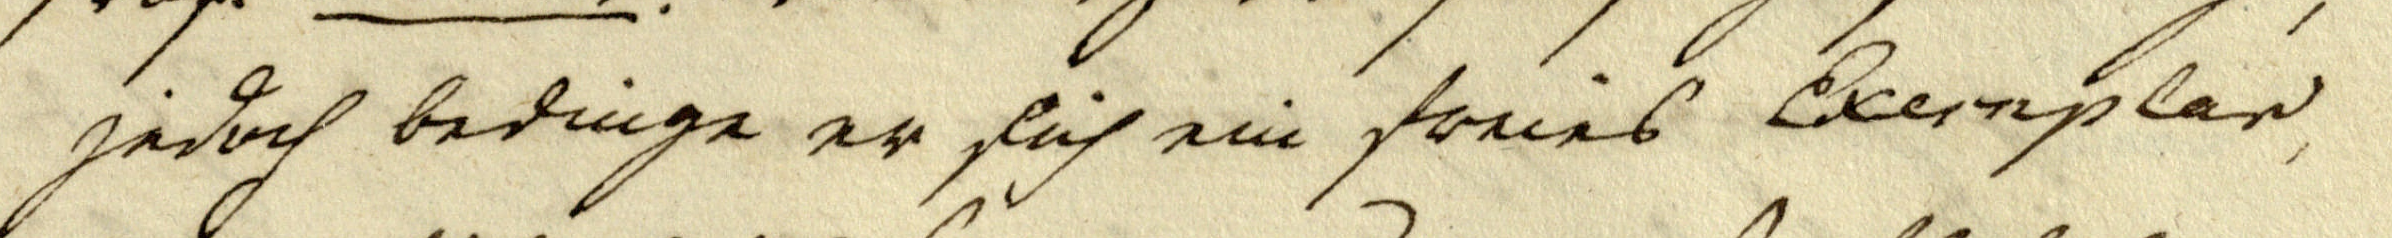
jedoch bedinge er sich ein freies Exemplar,
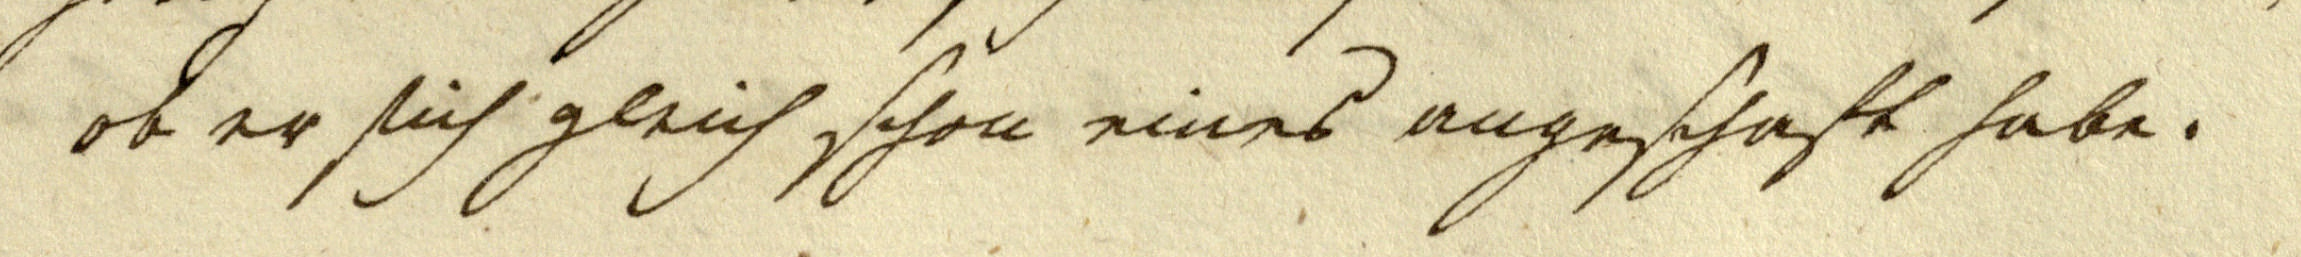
ob er sich gleich schon eines angeschaft habe.
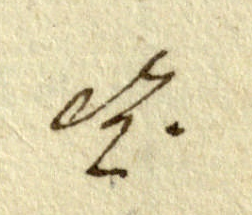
dh.
